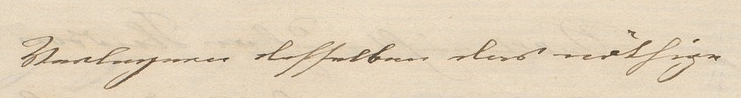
Verlegern desselben das nöthige
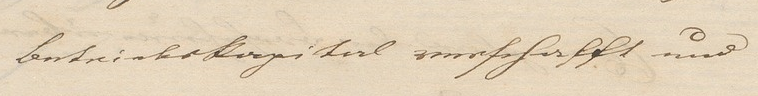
Betriebskapital verschafft und
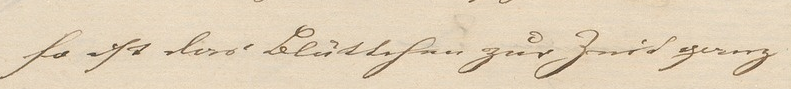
so ist das Blättchen zur Zeit ganz
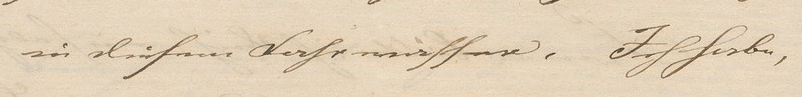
in diesem Fahrwasser. Ich habe,
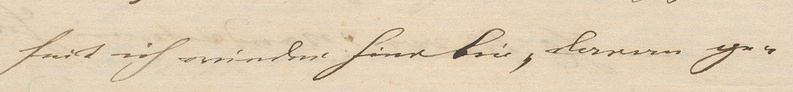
seit ich wieder hier bin, daran ge-
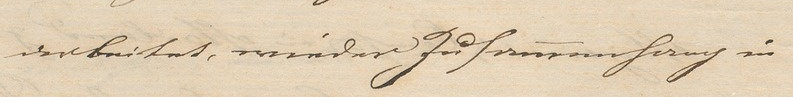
arbeitet, wieder Zusammenhang in
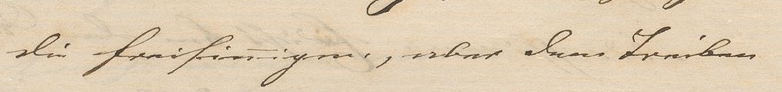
die freisinnigen, aber dem Treiben
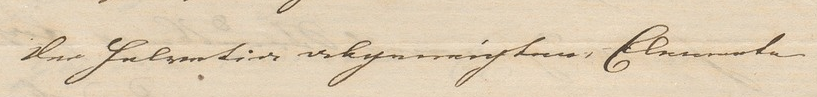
der Helvetia abgeneigten, Elemente
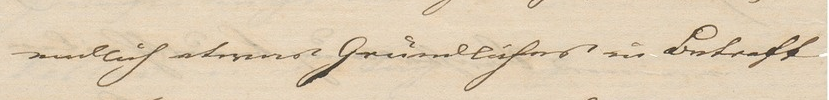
endlich etwas Gründliches in Betreff
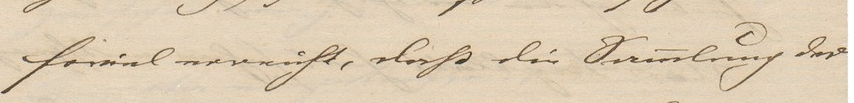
soviel erreicht, daß die Sammlung der
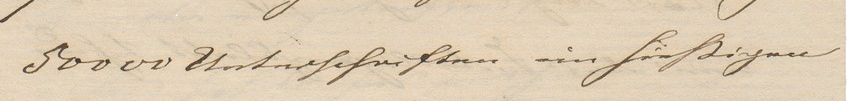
50000 Unterschriften im hießigen
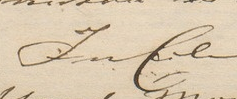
In Eile
